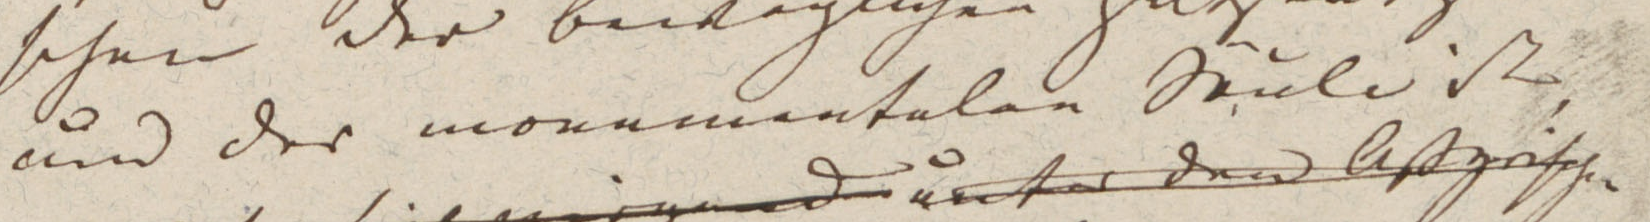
und der monumentalen Säule ist,
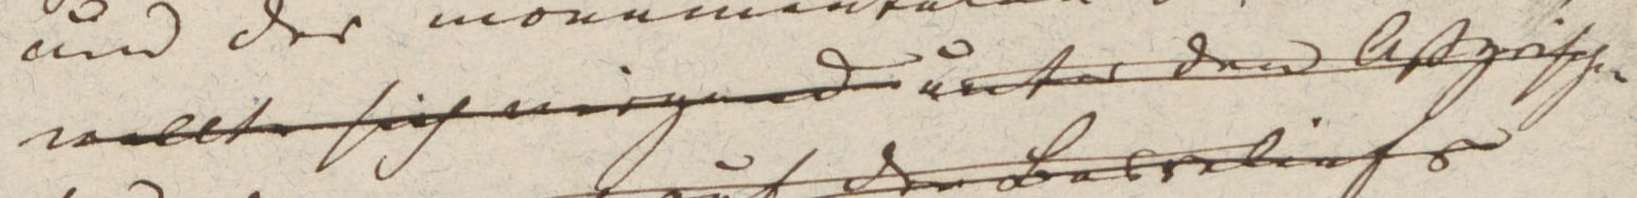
wollte sich nirgend unter den Assyrischen
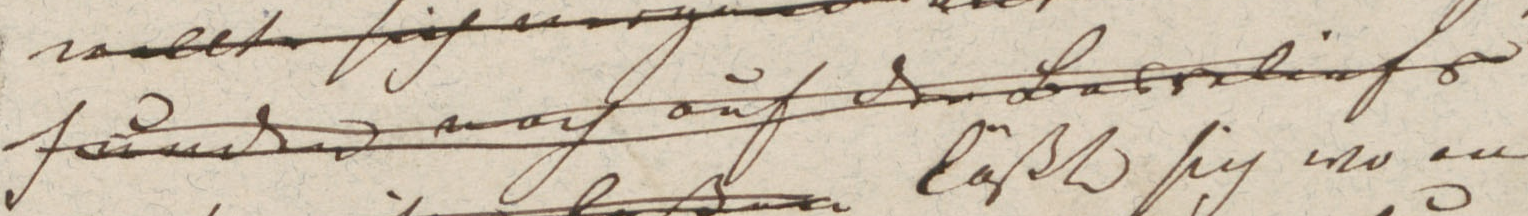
Funden noch auf den Basreliefs
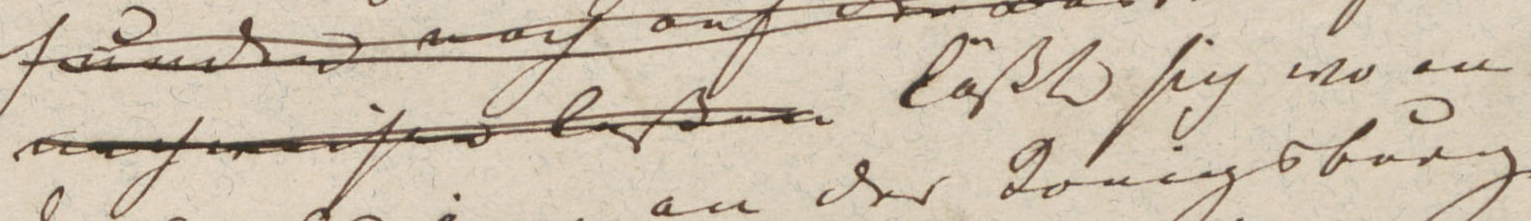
nachweisen lassen lässt sich wo an-
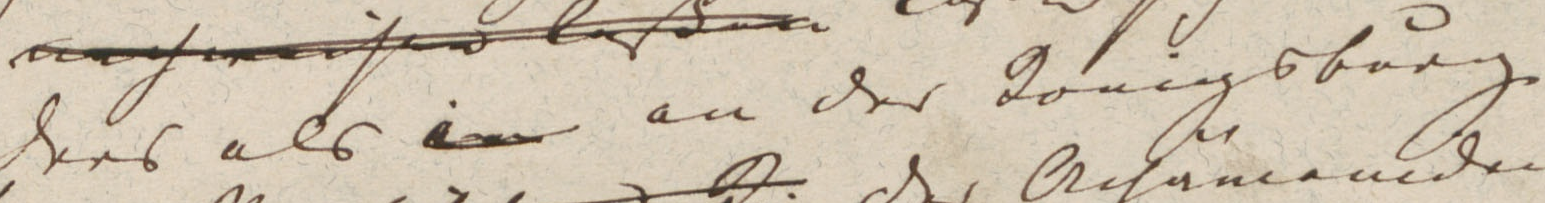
ders als in an der Konigsburg
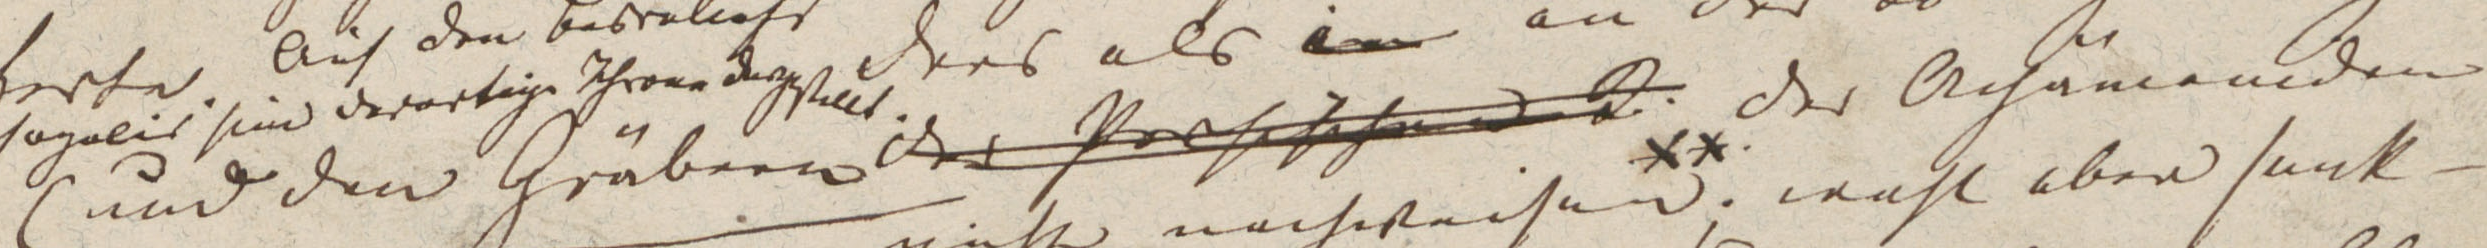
und den Gräbern des Persischen K der Achämeniden
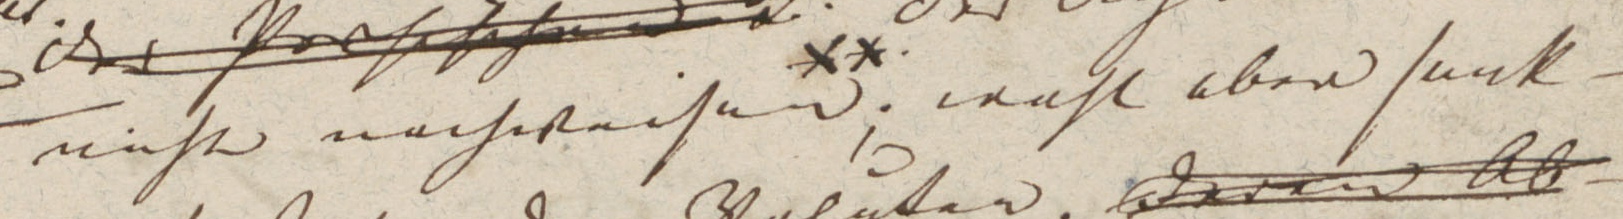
nicht nachweisen; % wohl aber senk-
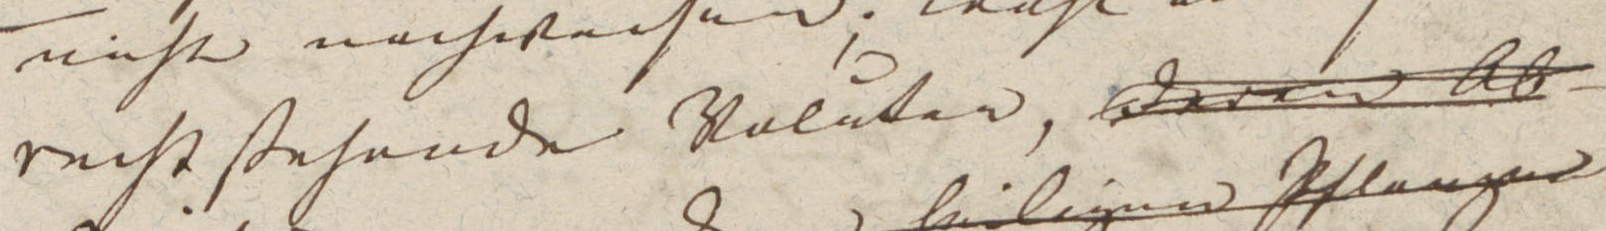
recht stehende Voluten, deren Ab-
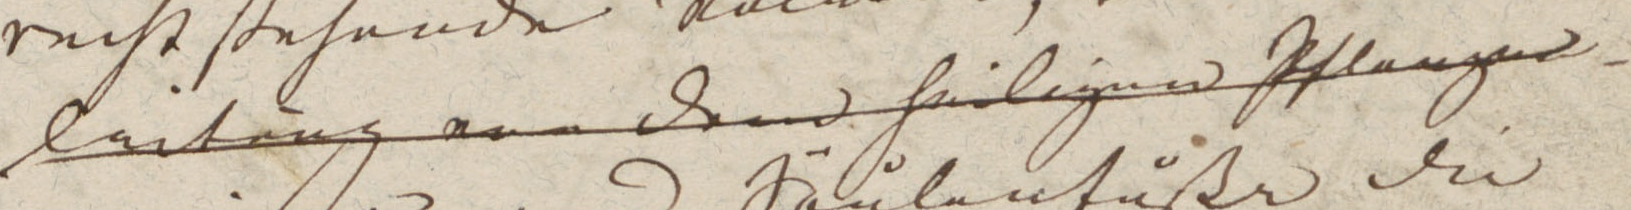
leitung von dem heiligen Pflanzen-
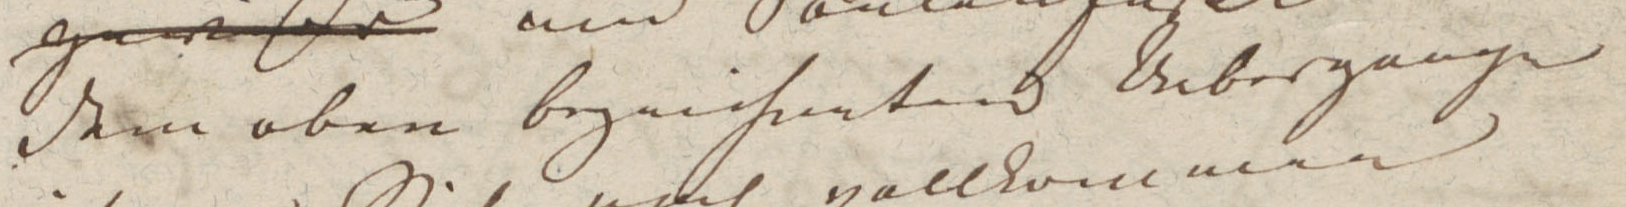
dem oben bezeichneten Uebergange
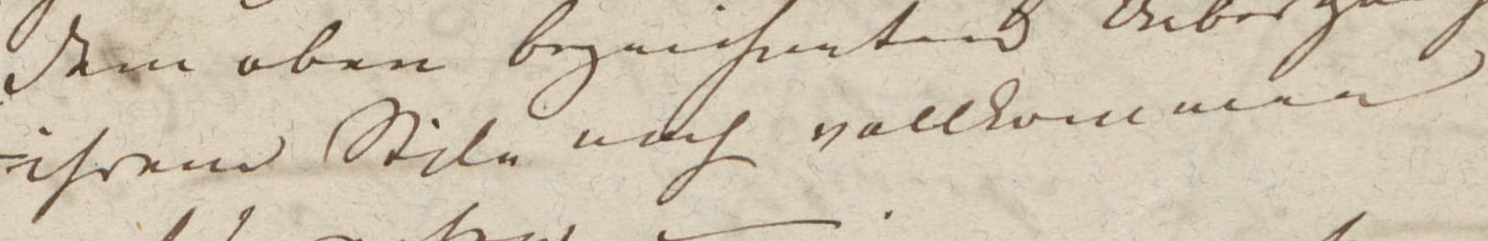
ihrem Stile nach vollkommen
